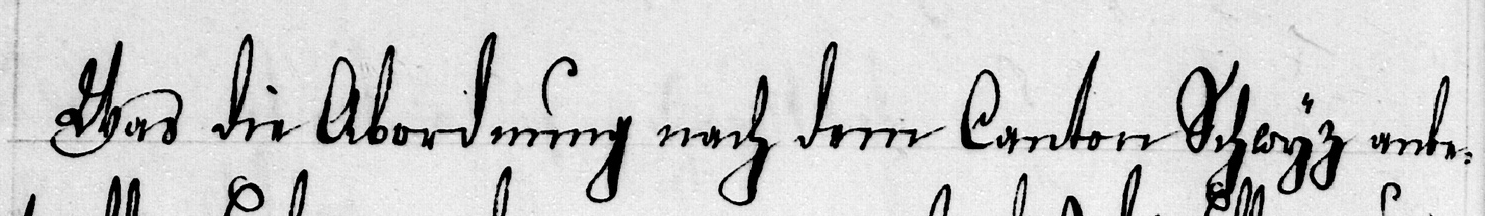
Was die Abordnung nach dem Canton Schwyz anbe¬
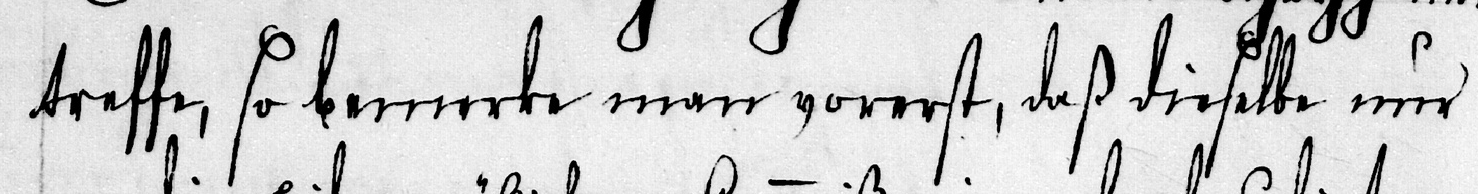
treffe, so bemerke man vorerst, daß dieselbe nur
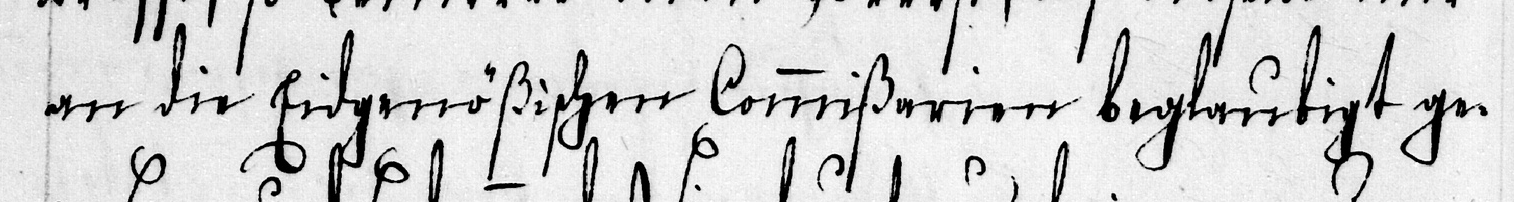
an die Eidgenößischen Commißarien beglaubigt ge¬
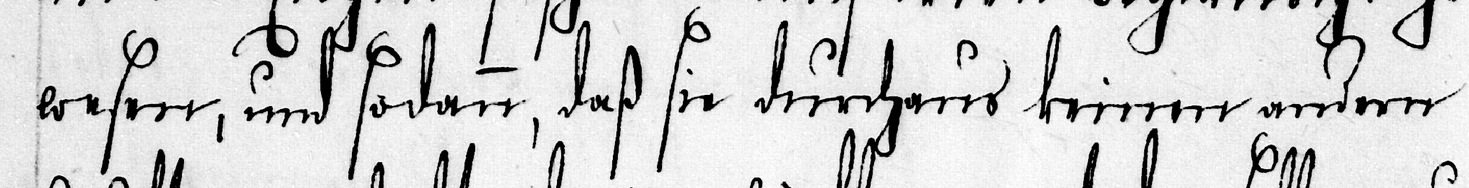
wesen, und sodann, daß sie durchaus keinen andern
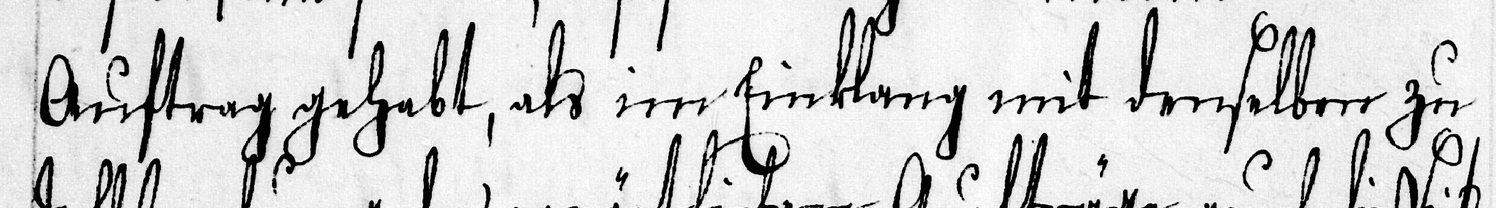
Auftrag gehabt, als im Einklang mit denselben zu
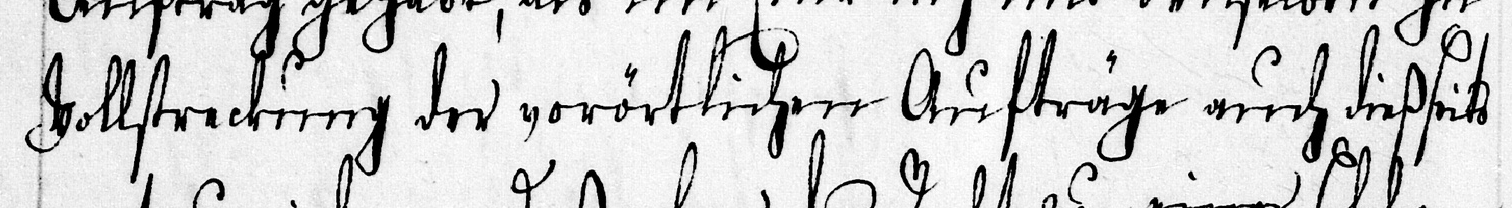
Vollstreckung der vorörtlichen Aufträge auch dießs¬
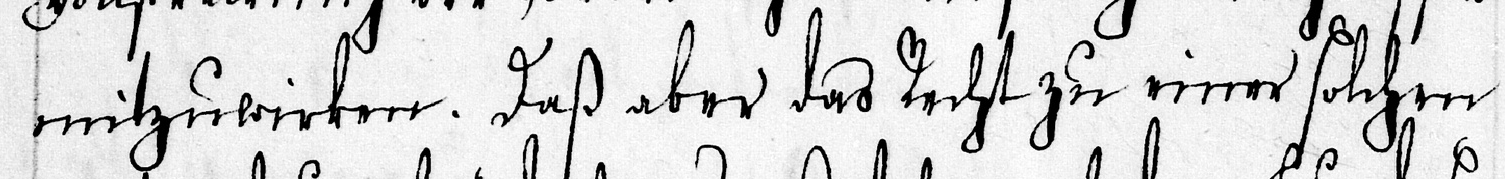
mitzuwirken. Daß aber das Recht zu einer solchen
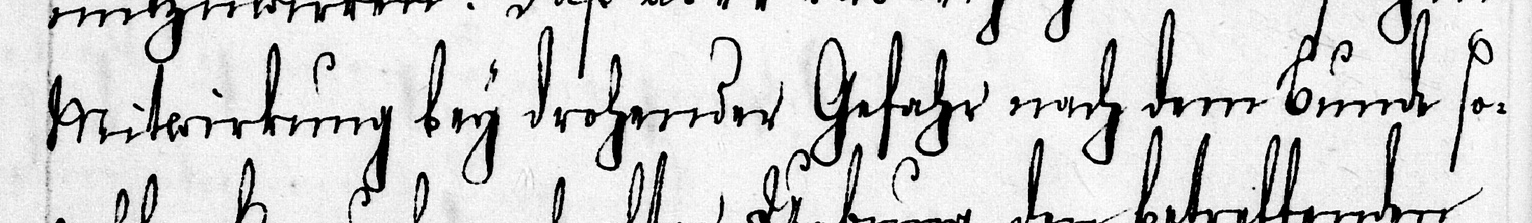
Mitwirkung bey drohender Gefahr nach dem Bunde so¬
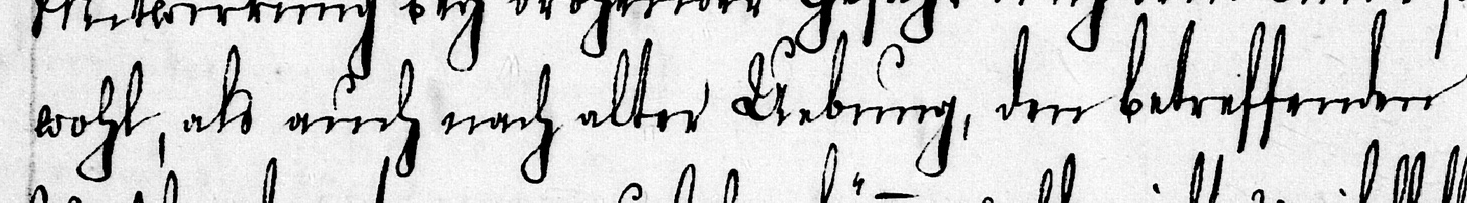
wohl, als auch nach alter Uebung, den betreffenden
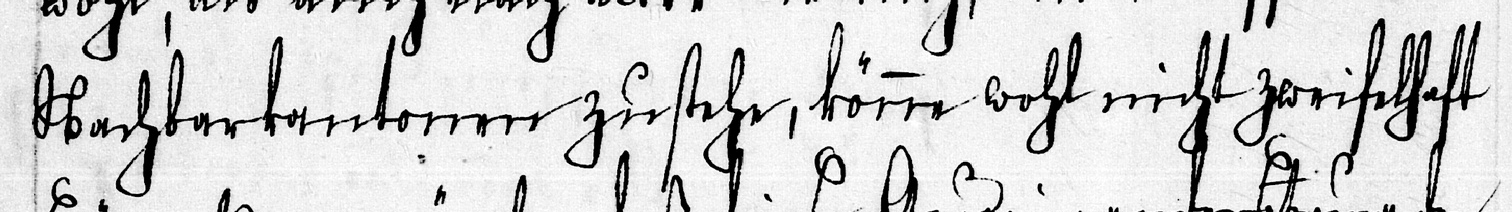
Nachbarkantonen zustehe, könne wohl nicht zweifelhaft
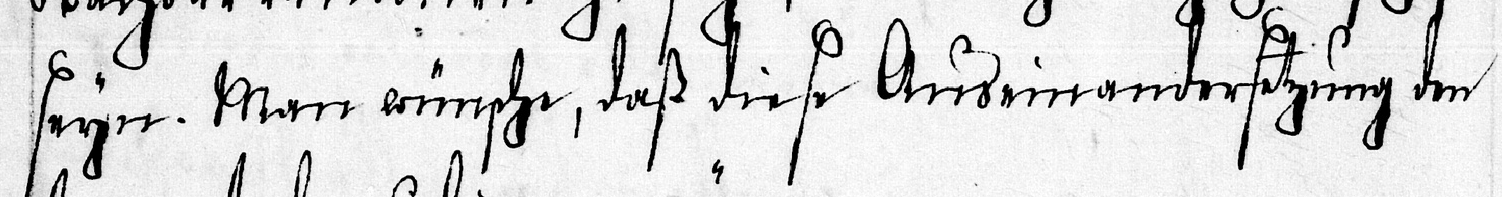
seyn. Man wünsche, daß diese Auseinandersetzung den
